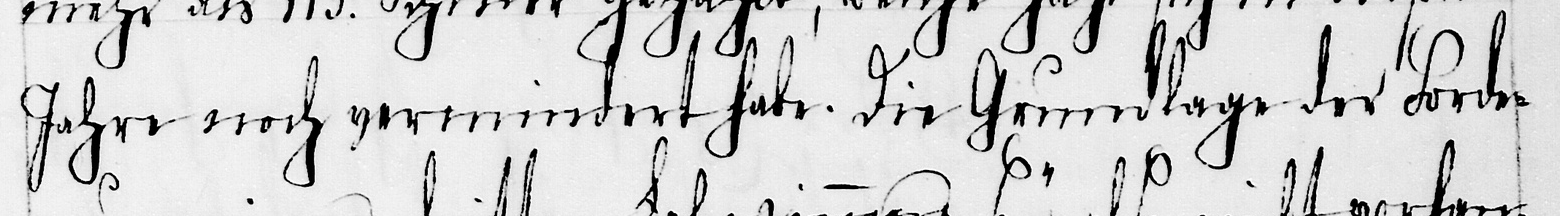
Jahre noch vermindert habe. Die Grundlage der Forde¬
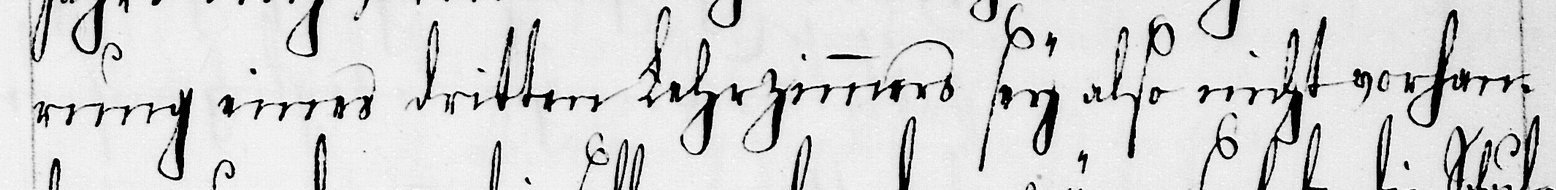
rung eines dritten Lehrzimmers sey also nicht vorhan¬
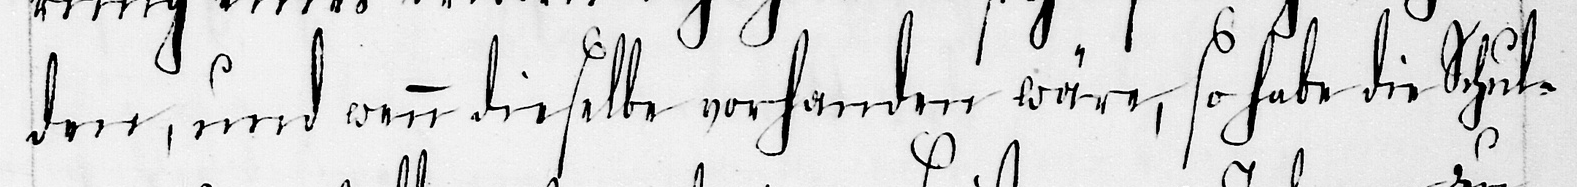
den, und wenn dieselbe vorhanden wäre, so habe die Schu¬
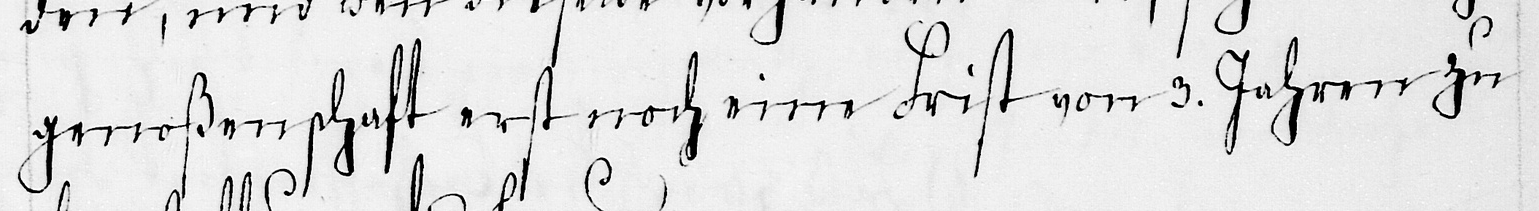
lgenoßenschaft erst noch eine Frist von 3. Jahren zu
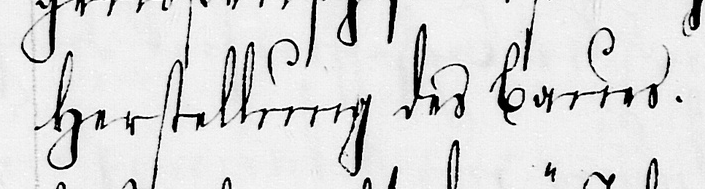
Herstellung des Baues.
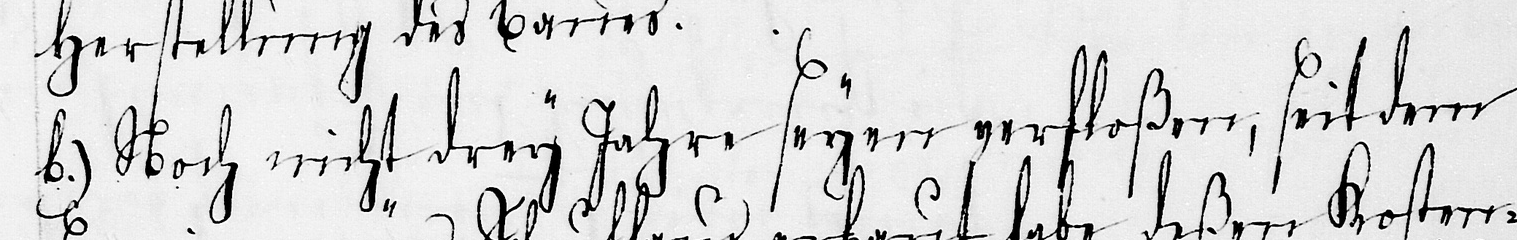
b.) Noch nicht drey Jahre seyen verfloßen, seit dem
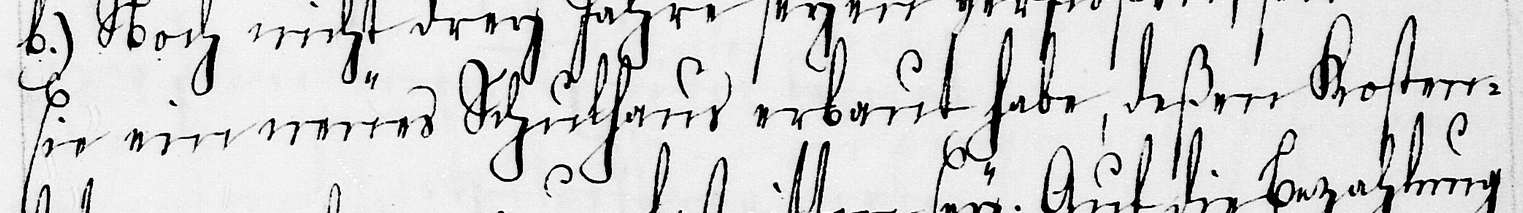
sie ein neues Schulhaus erbaut habe, deßen Kosten¬
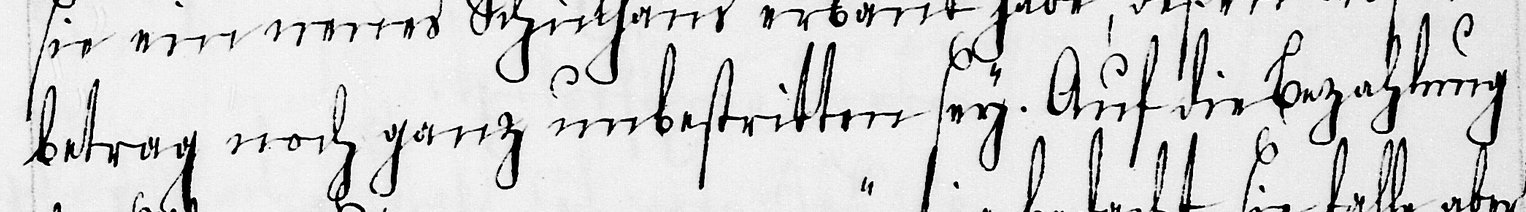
betrag noch ganz unbestritten sey. Auf die Bezahlung
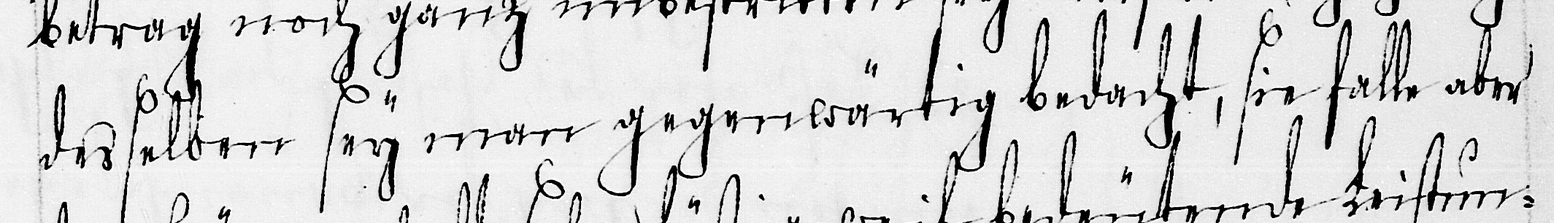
desselben sey man gegenwärtig bedacht, sie falle aber
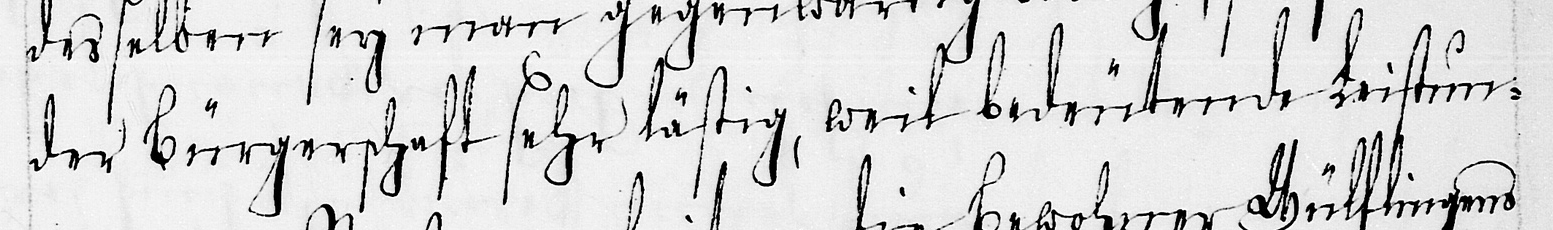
der Bürgerschaft sehr lästig, weil bedeutende Leistun¬
